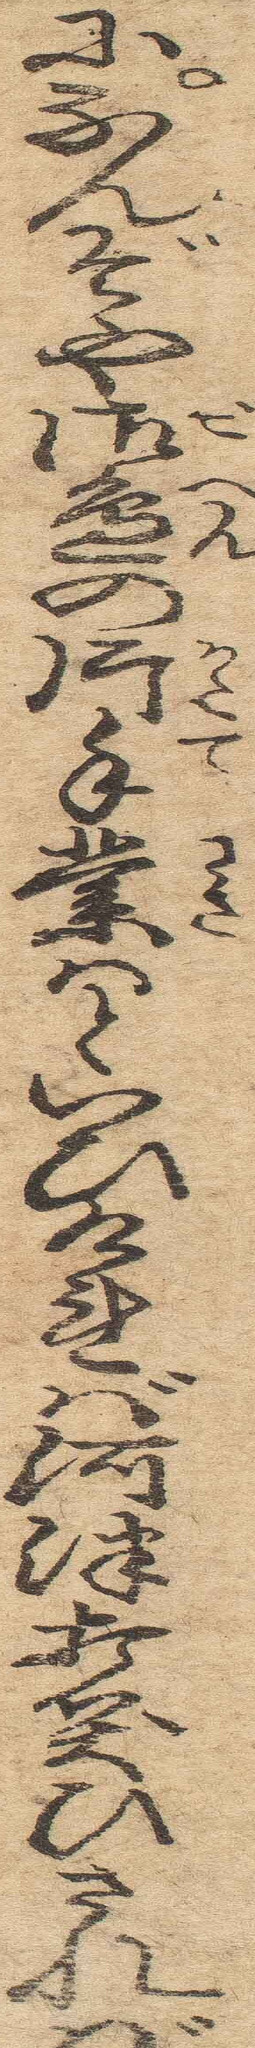に。なんぞや御辺の片手業はといひければ河津打笑ひされば
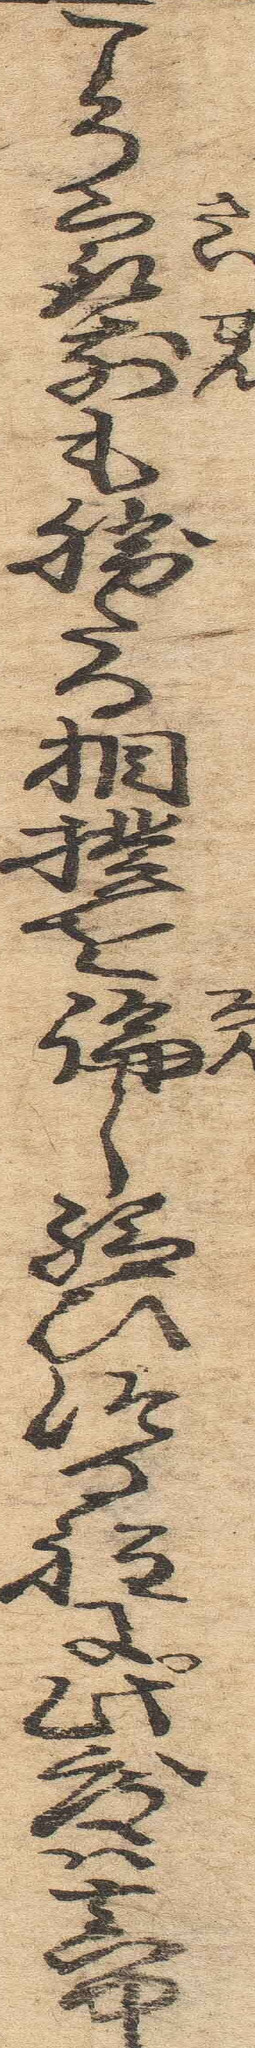こそ最前も勝たる相撲を論し給ひける程に。此度は真中
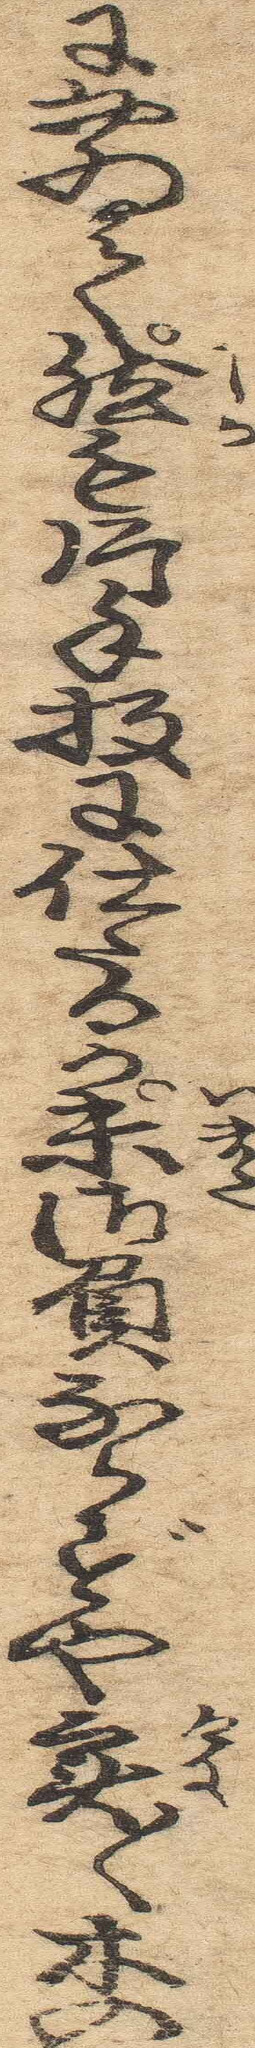におゐて。然も片手投に仕たるか。未御負ならずや実〳〵木の
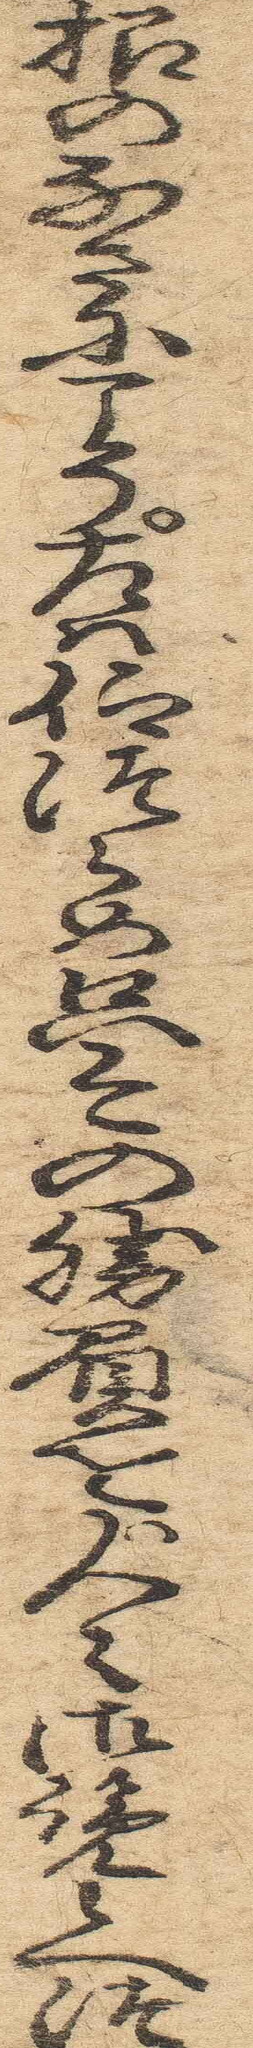根のなきにこそ。右は仰つらめ只その勝負を人々御覧候へつ
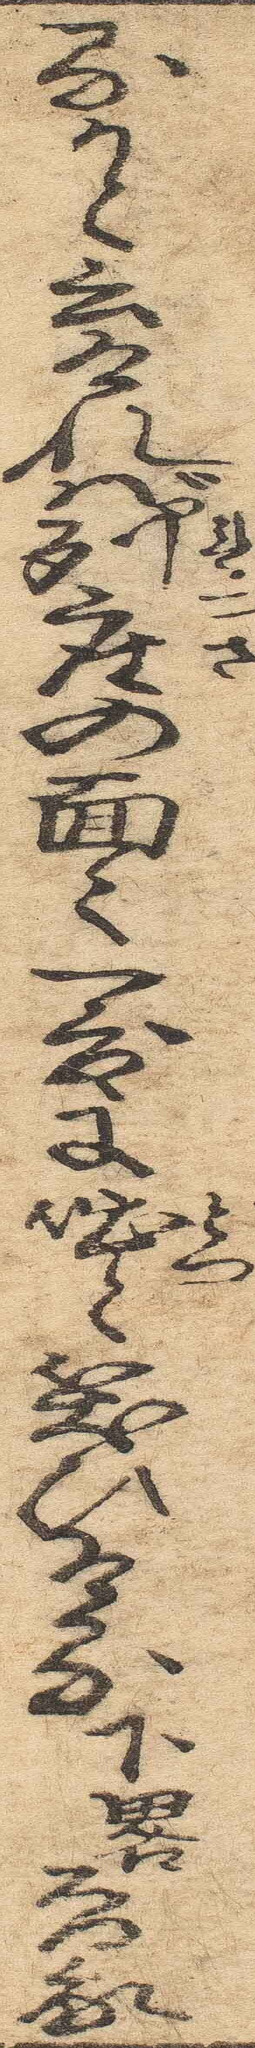るかと云ければ。列座の面々一度に咄と笑ひける下略曽我
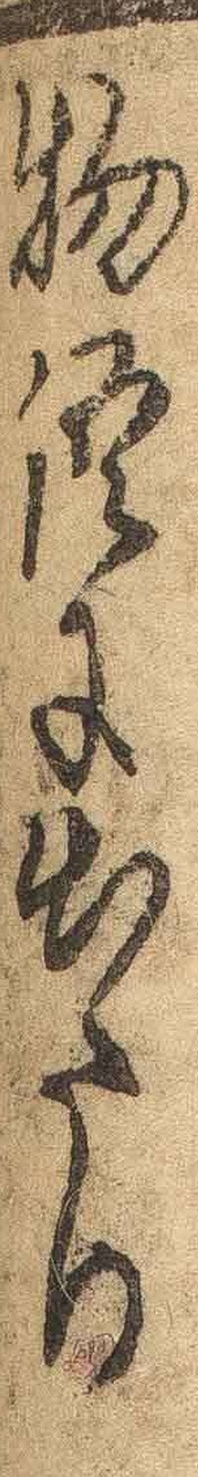物語に出たり
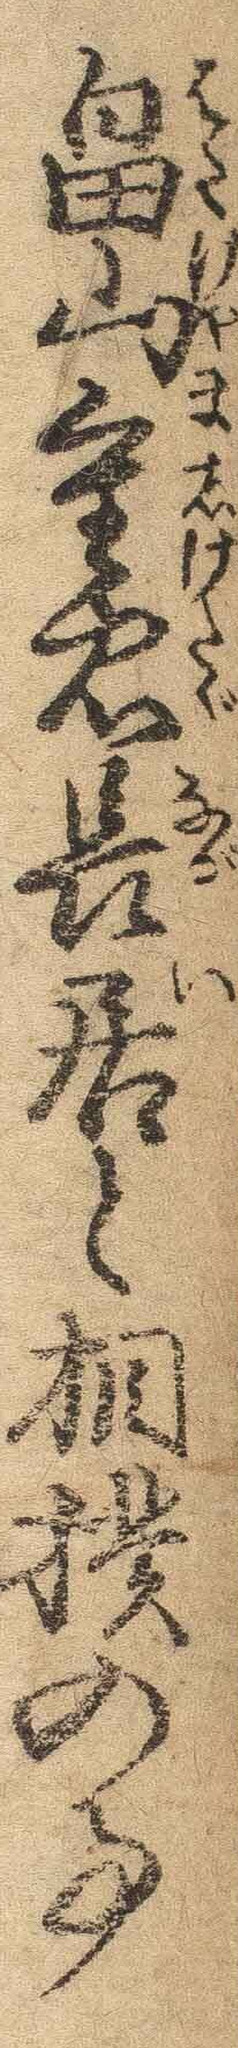畠山重忠長居と相撲の事
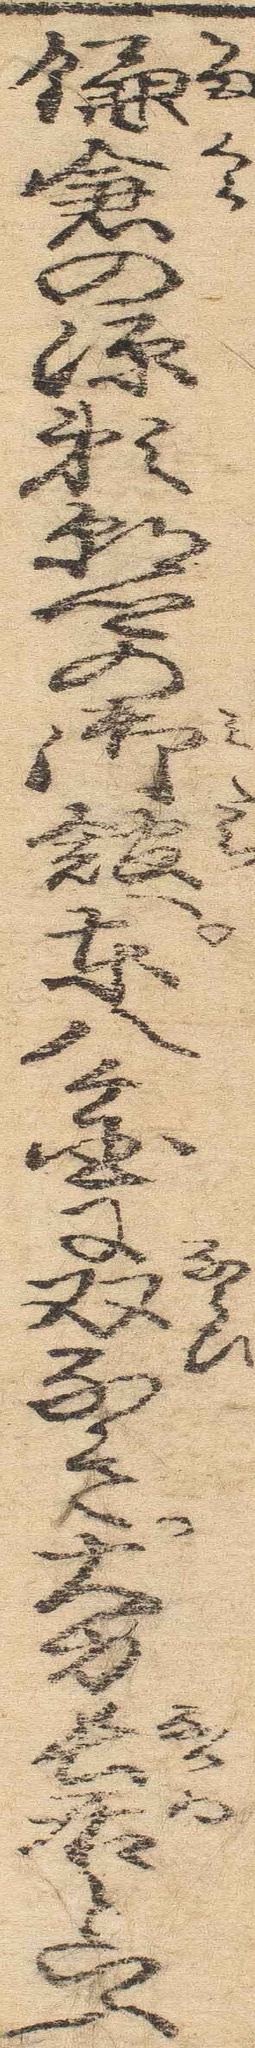鎌倉の源頼朝卿の御館へ。東八ヶ国に双なき。大力長居といふ
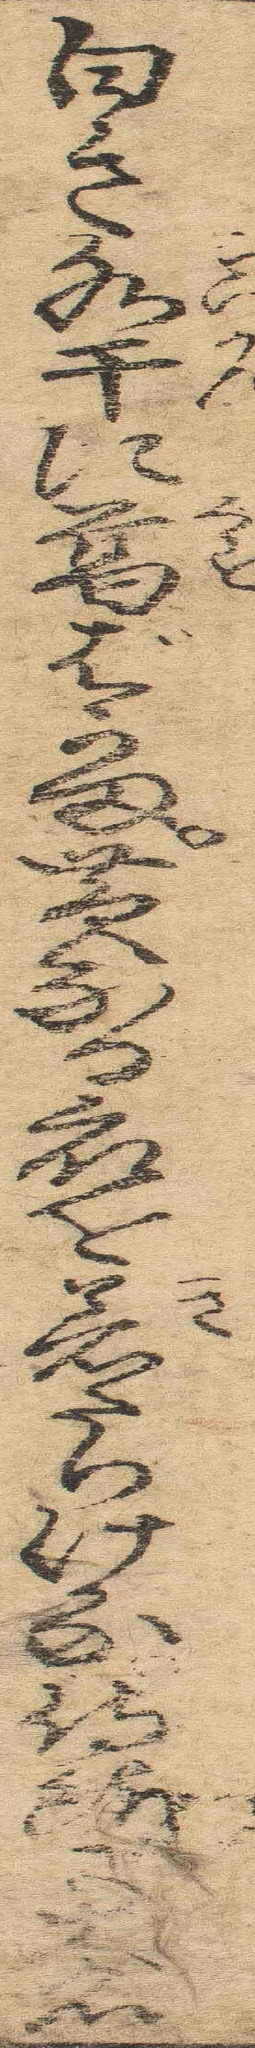白き水干に葛ばかま。黄なる衣を着たるける侍所に大名
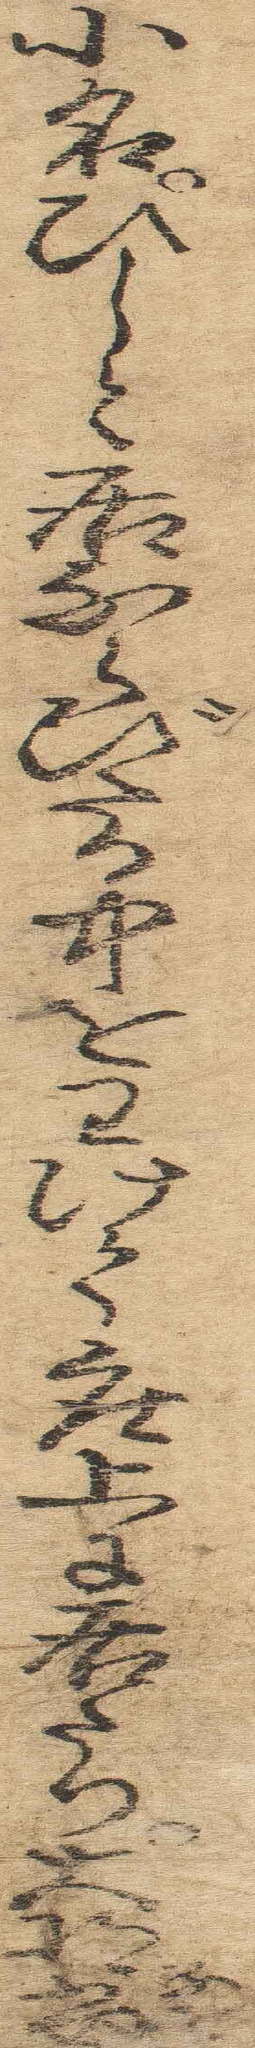小名。ひしと居ならびたり中をわけて座上に居たる。大将尚
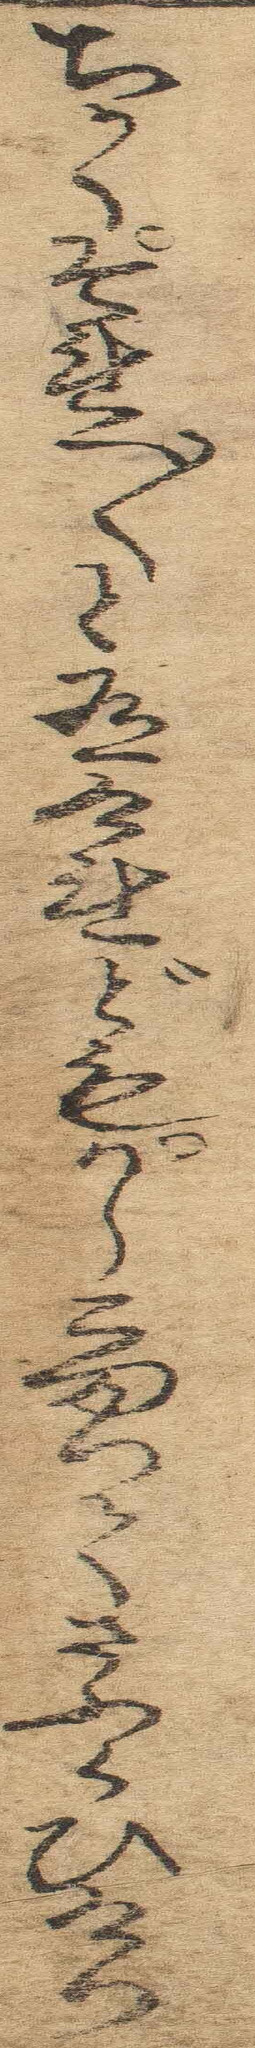ちかく。それへ〳〵と有けれども。かしこまりてさふらひけり

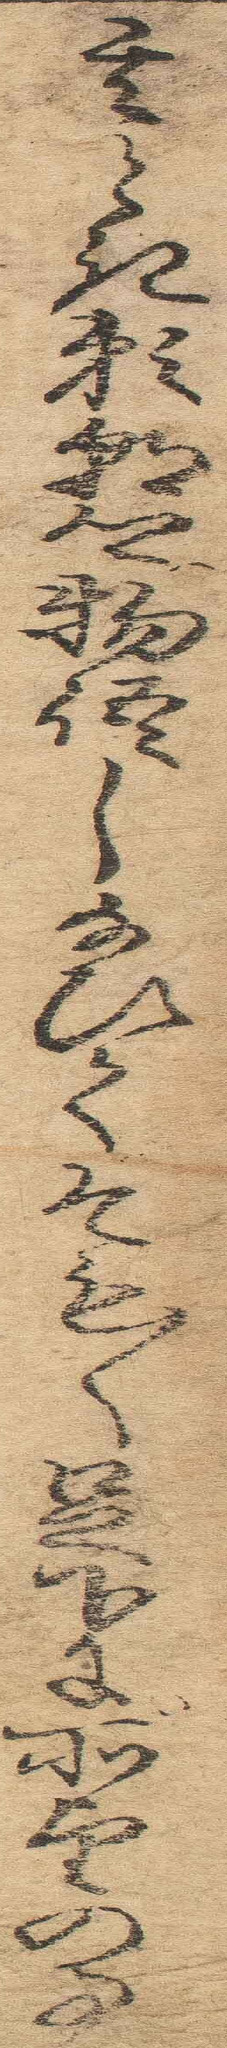其とき頼朝卿物語し給ひてそも〳〵足下に所望の事
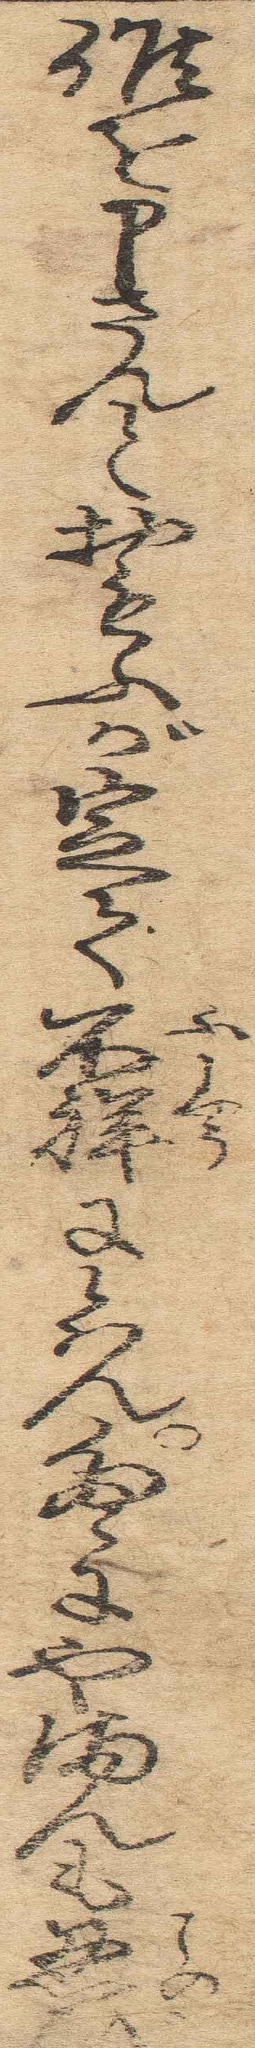誰を申さんとおもふが宣て不詳に候はん。為にやまんも忍び
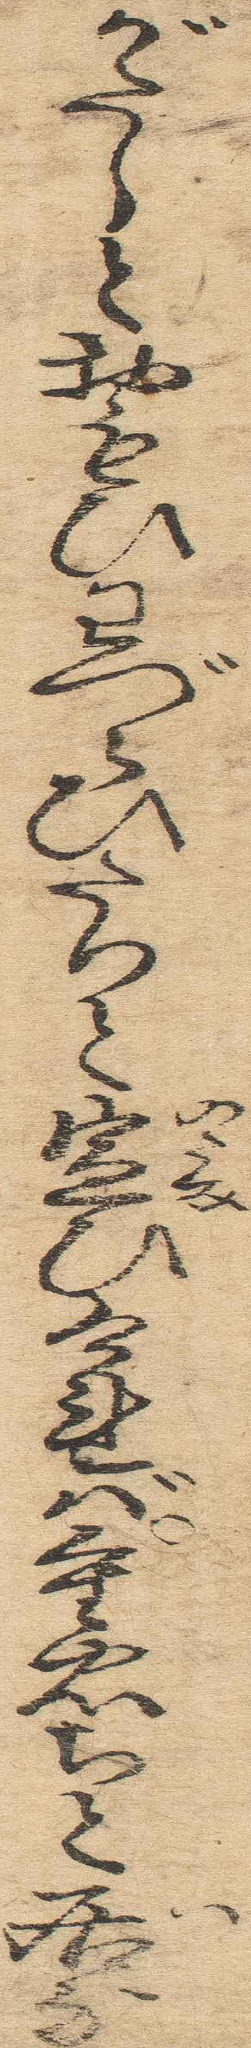がたしとおもひわづらひたりと宣ければ。重忠ちと居な
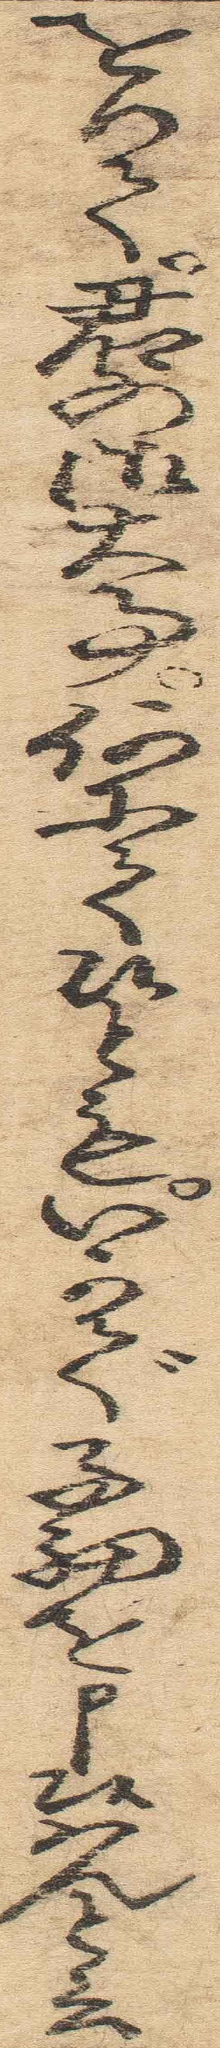をりて。君の御大事。何にて候とも。いかで子細を申候はんと云
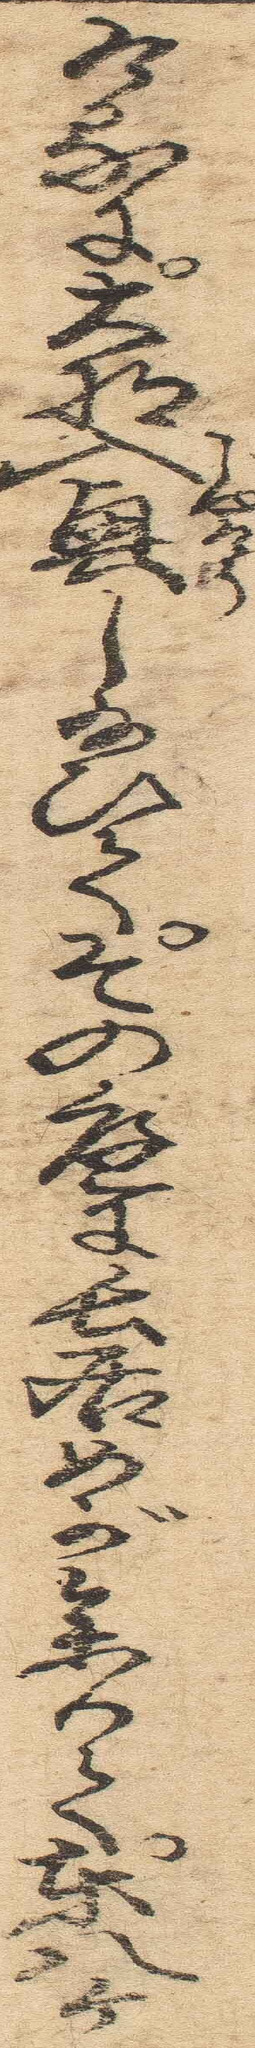たるに。大将入輿し給ひて。その庭に長居めが参りて。東八ヶ
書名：古今相撲大全
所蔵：東京学芸大学附属図書館 国文学研究資料館
